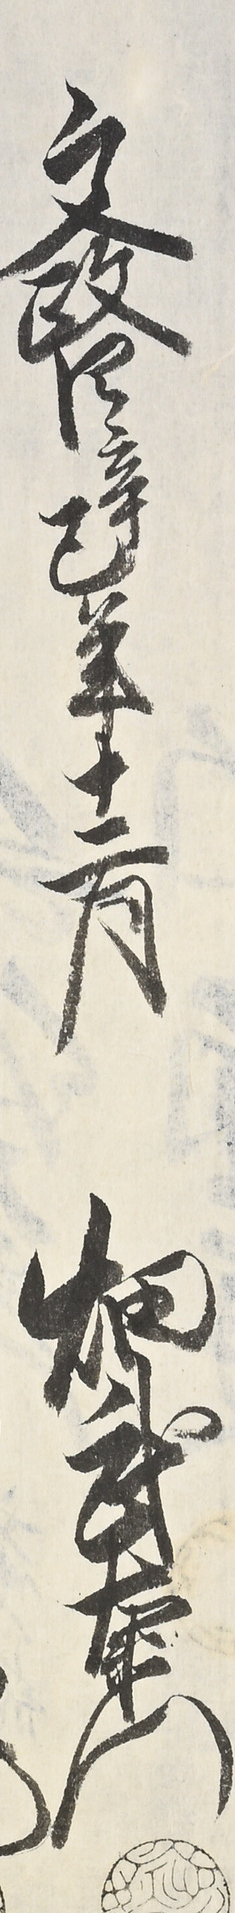文政四辛巳年十二月畑武右衛門㊞
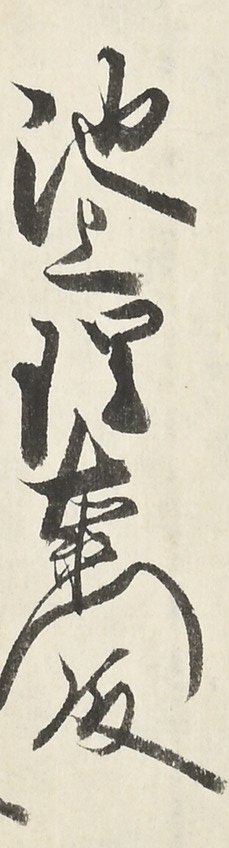池上理右衛門殿
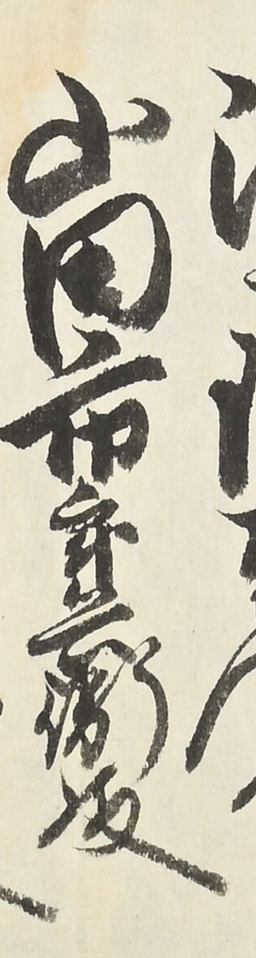山田市郎兵衛殿
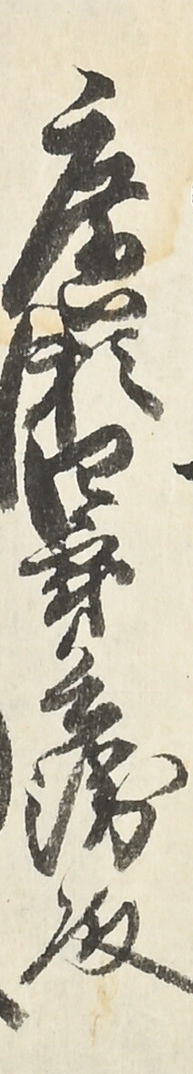廣瀬四郎兵衛殿
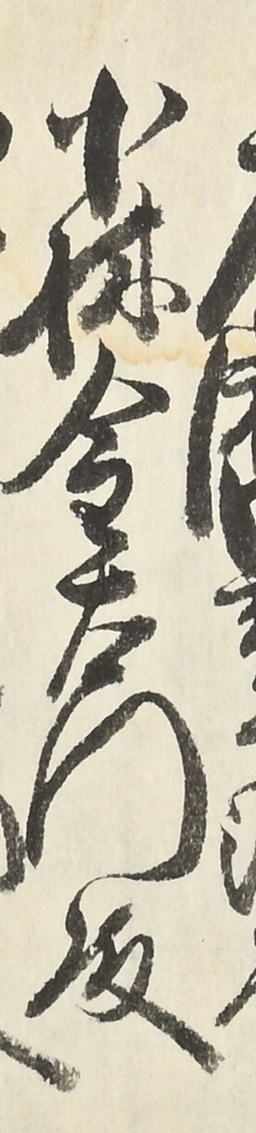小林金右衛門殿
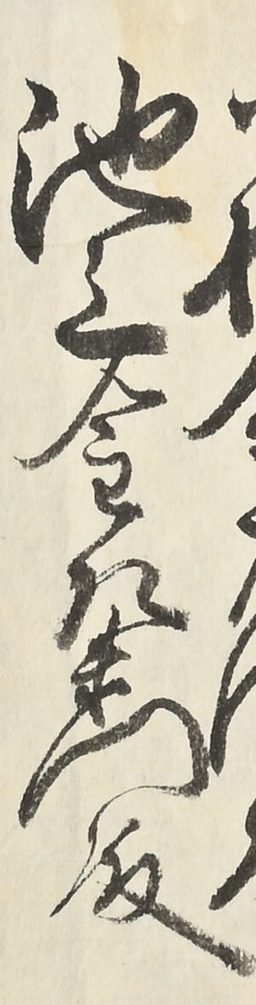池上金左衛門殿

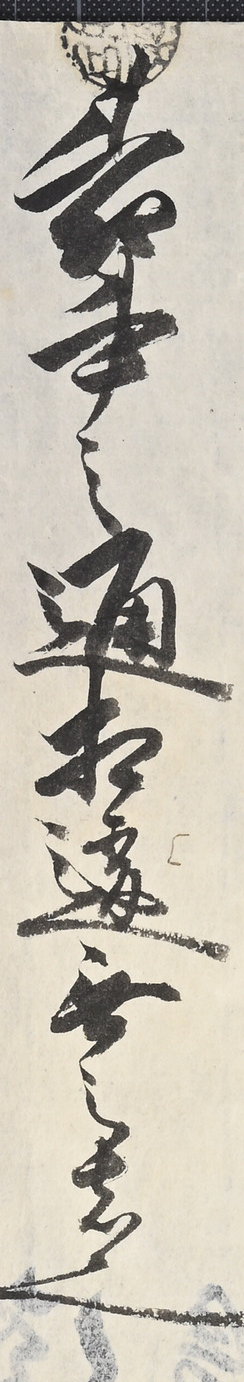表書之通相違無之者也
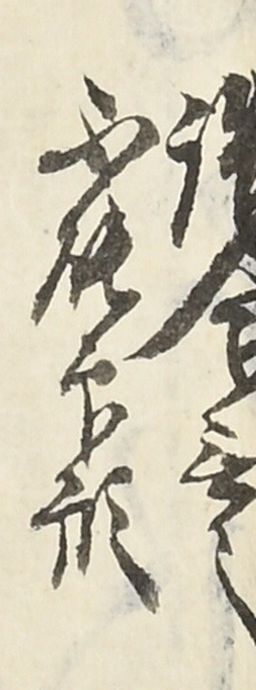不能印形

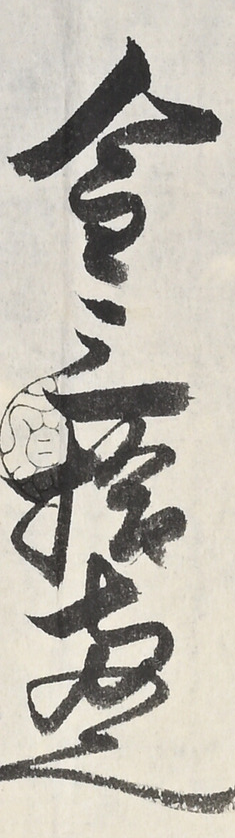金三拾両也
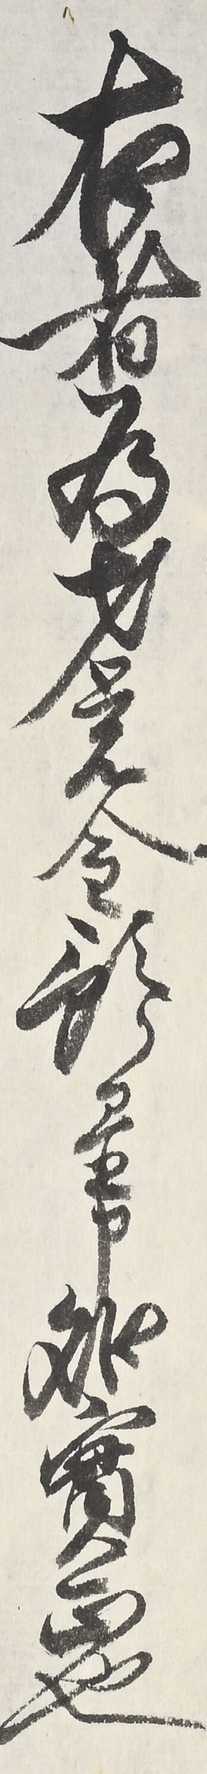右者為才覚金預置申処実正也
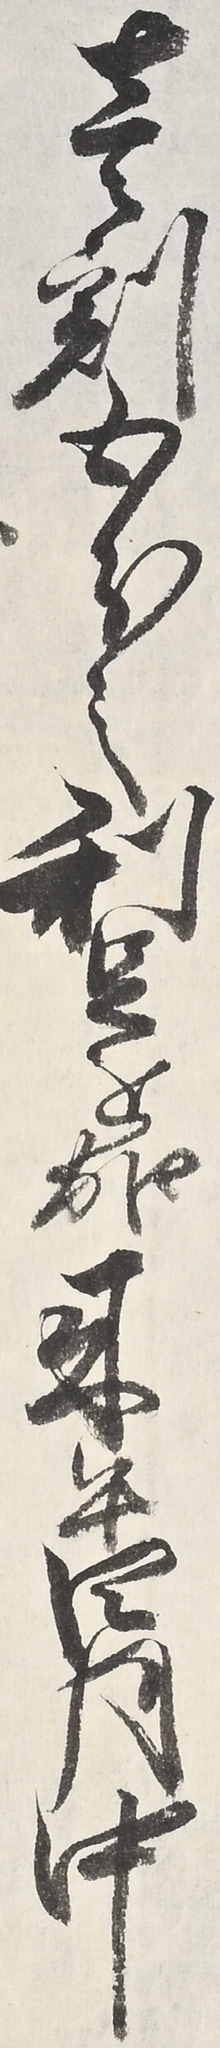壱割五分之利足を加来午四月中
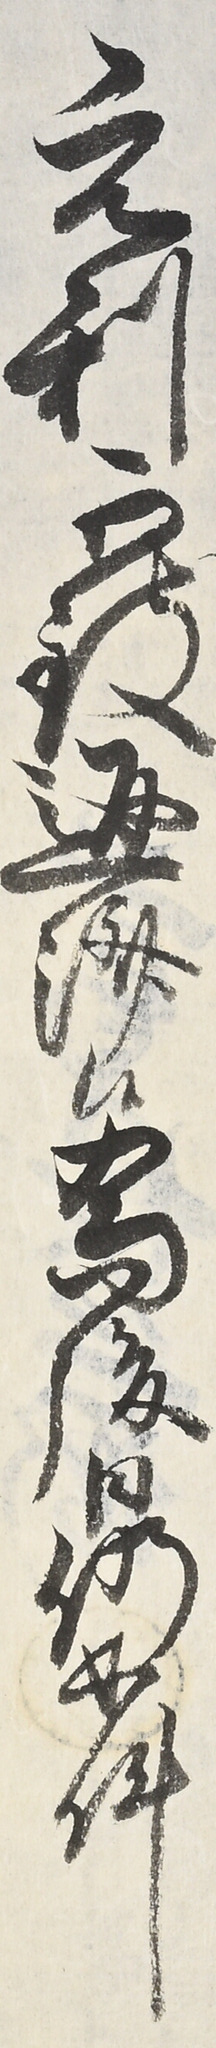元利可致返済候為後日仍如件
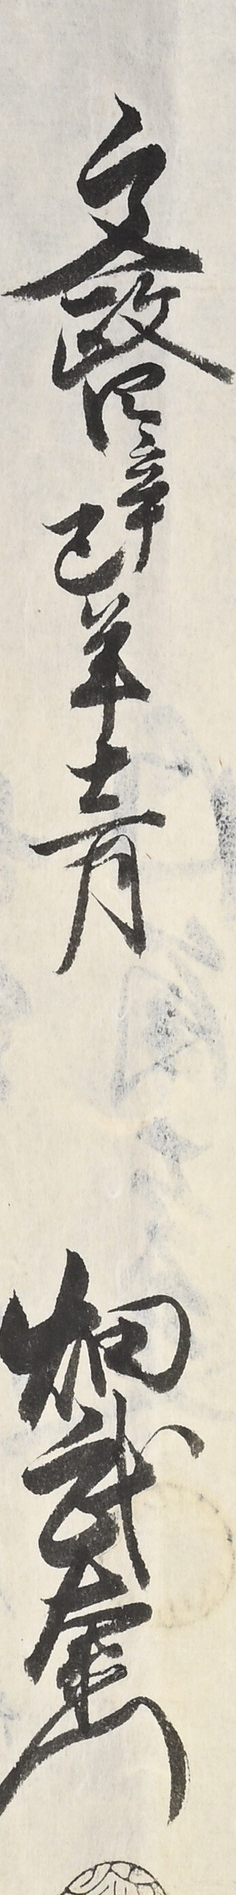文政四辛巳年十二月畑武右衛門㊞
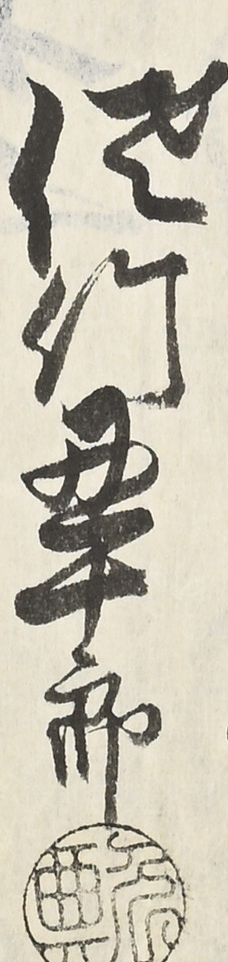佐竹丑十郎㊞
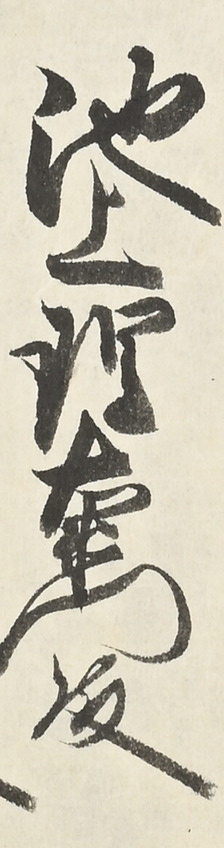池上理右衛門殿
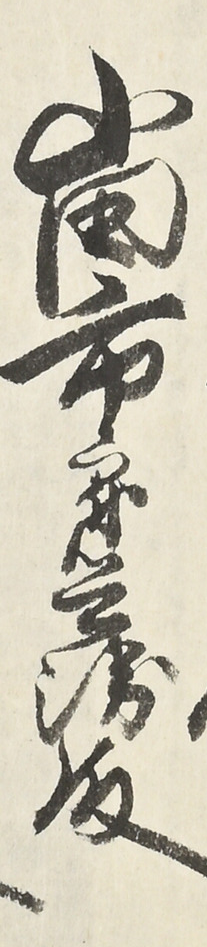山田市郎兵衛殿
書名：覚
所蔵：伊那市立高遠町図書館・合同会社AMANE
